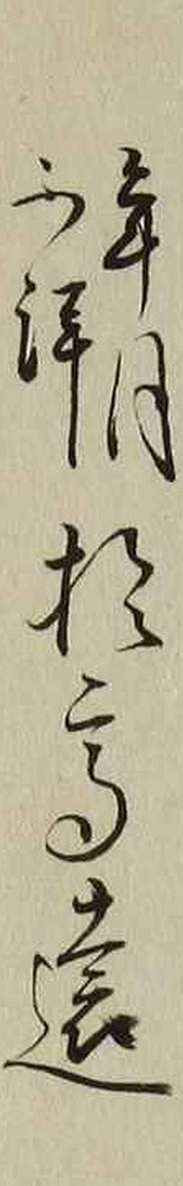不詳於高遠
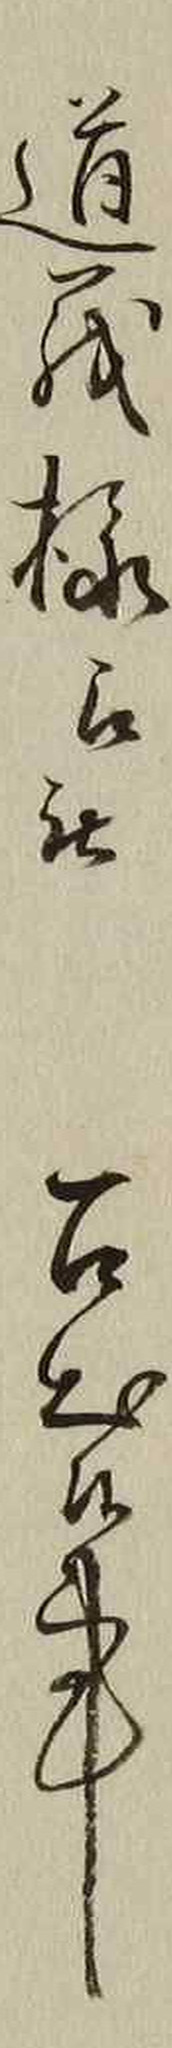道義様江被召出候事
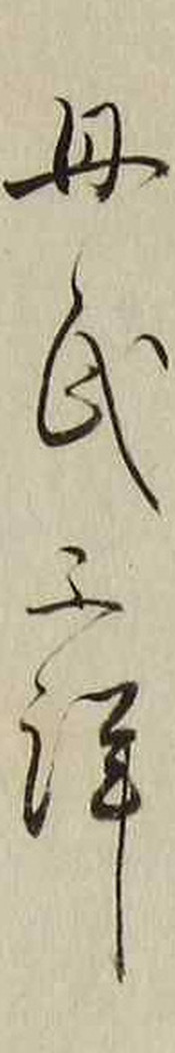母氏不詳
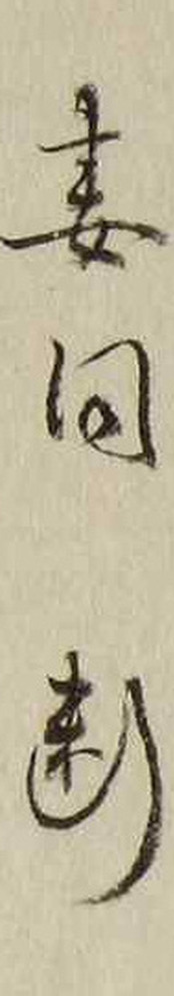妻同断

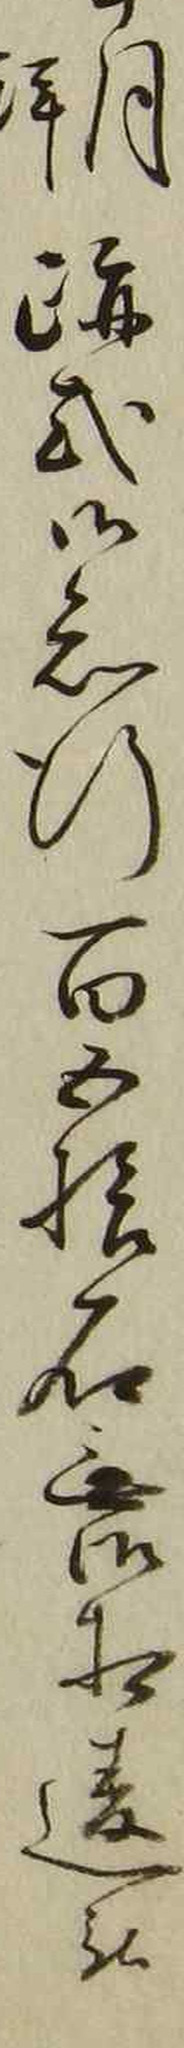不詳跡式御知行百五拾石無御相違被
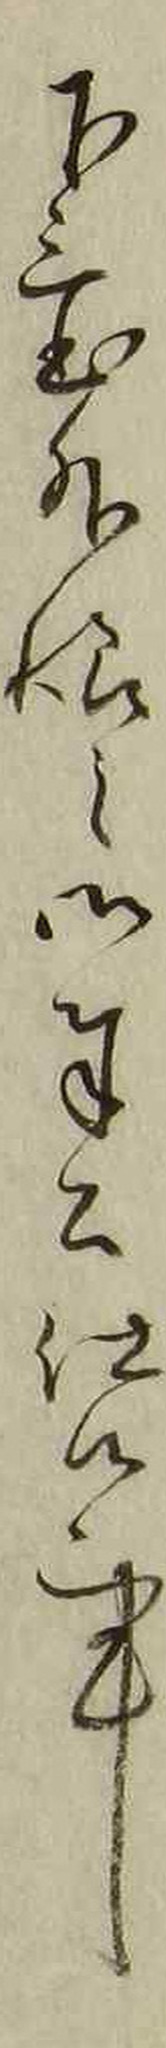下置外様之御奉公仕候事
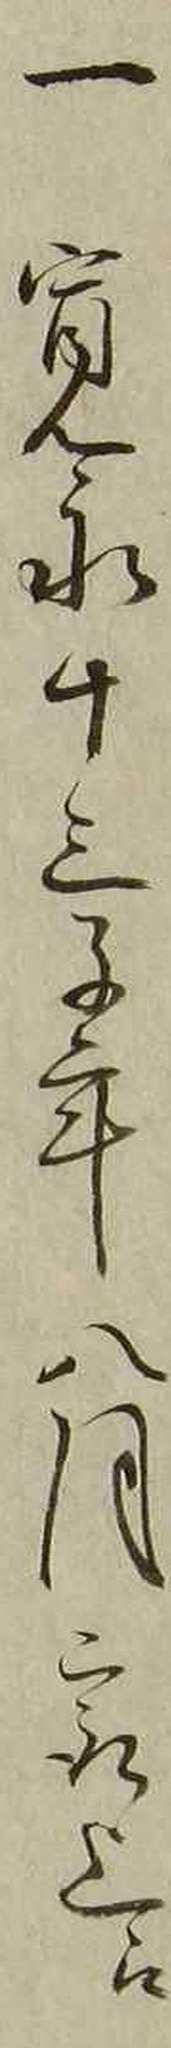一寛永十三子年八月最上江
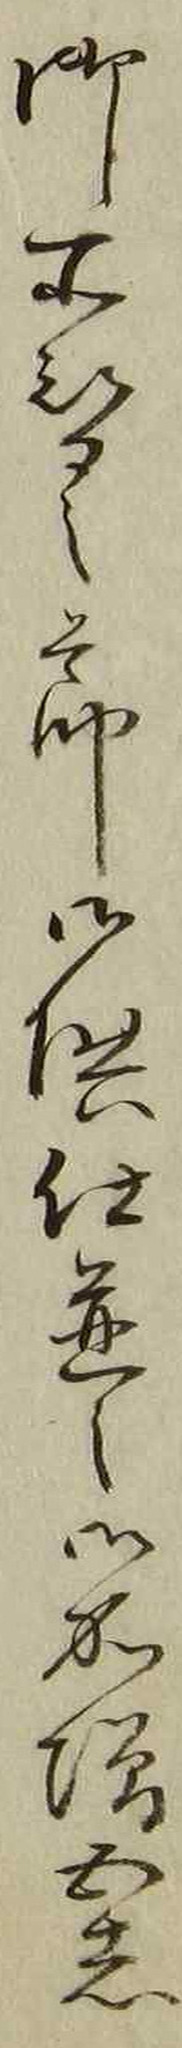御所替之節御供仕並之御加増五十石
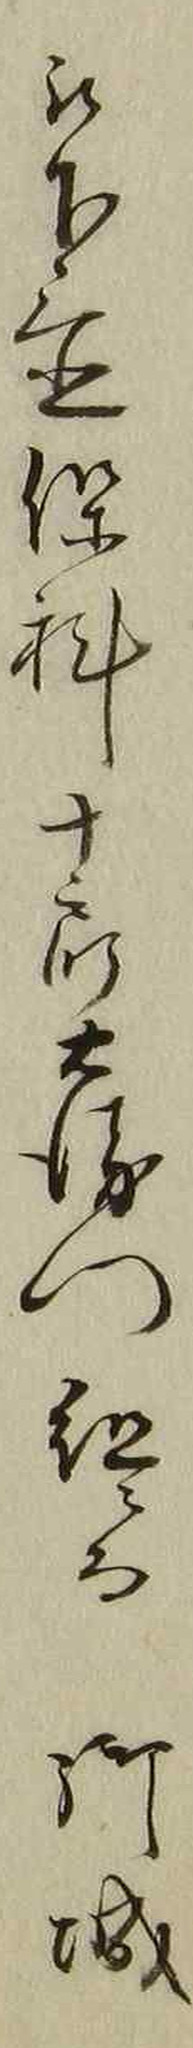被下置保科十郎右衛門組ニ而御城
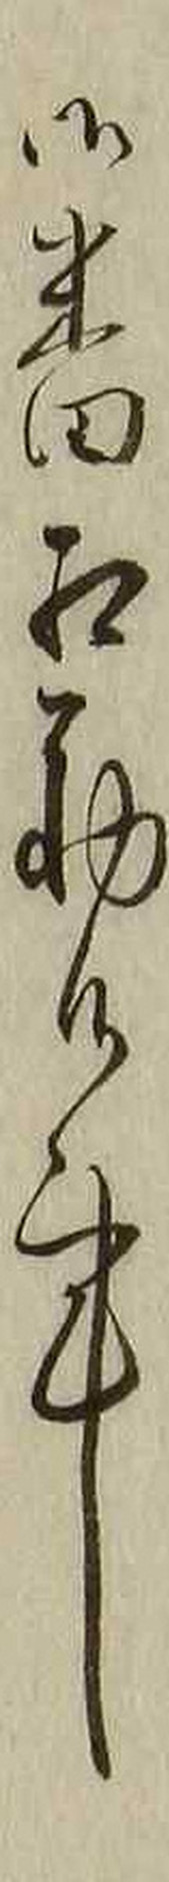御番相勤候事
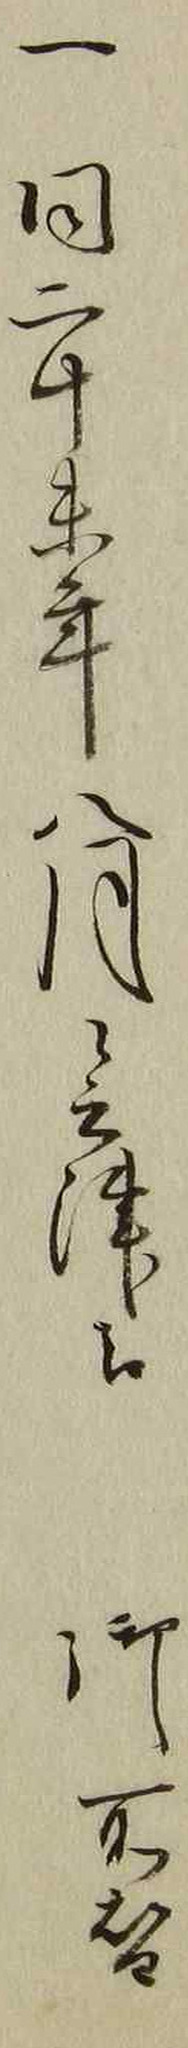一同二十未年八月会津江御所替
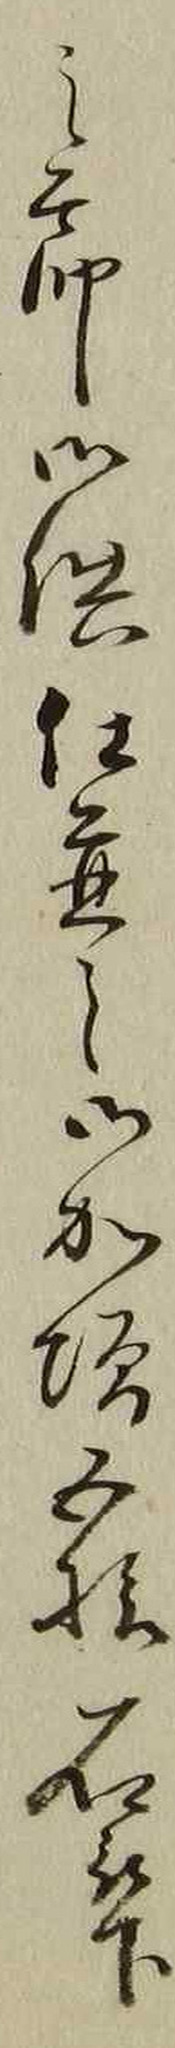之節御供仕並之御加増五拾石被下
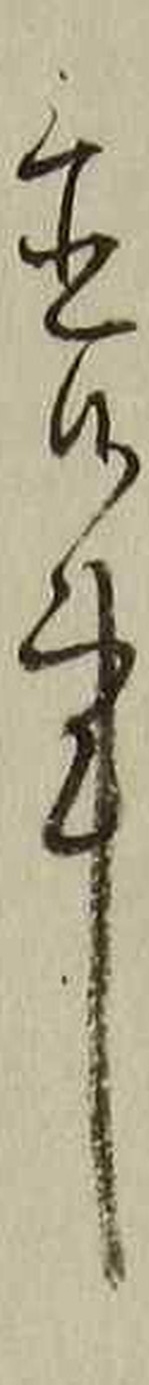置候事
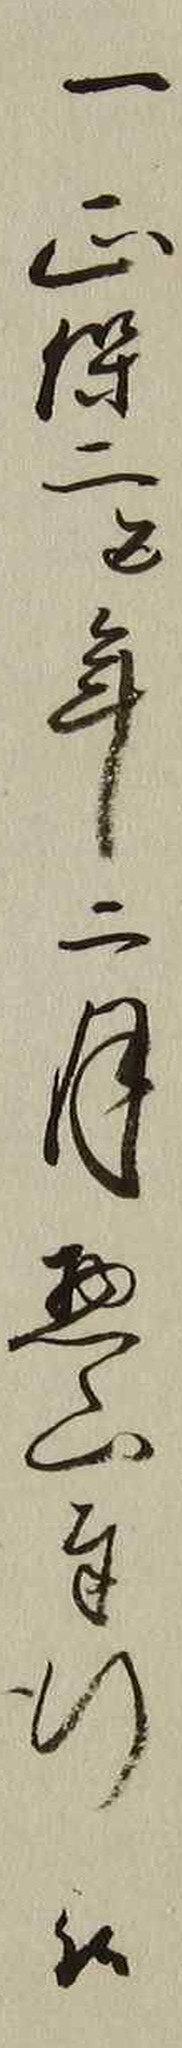一正保二酉年二月惣山奉行被
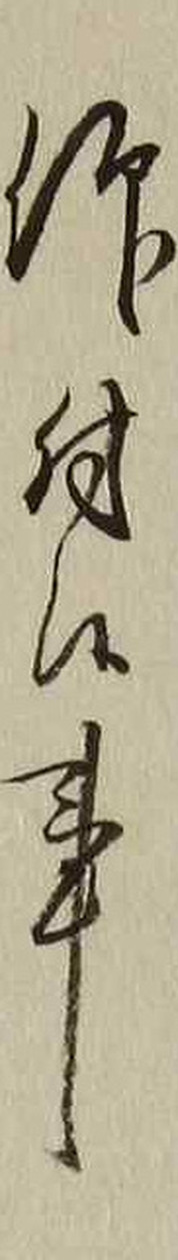仰付候事
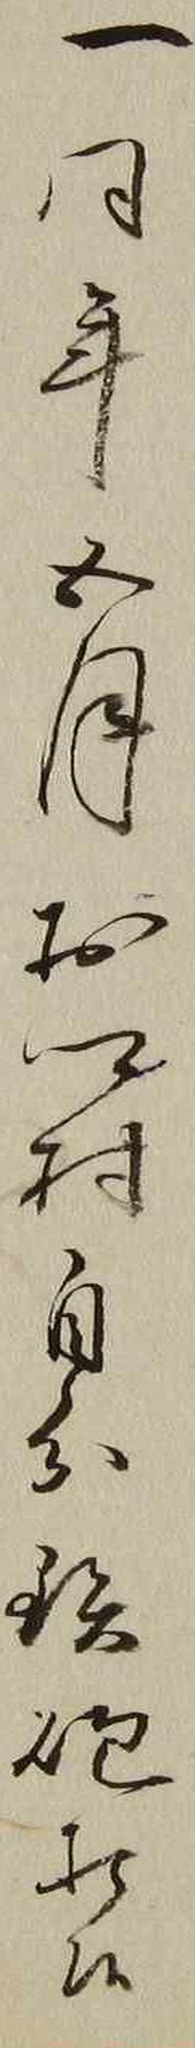一同年五月於郷村自分鉄炮打候
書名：諸士系譜　巻之2　い之部2
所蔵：会津若松市立会津図書館
